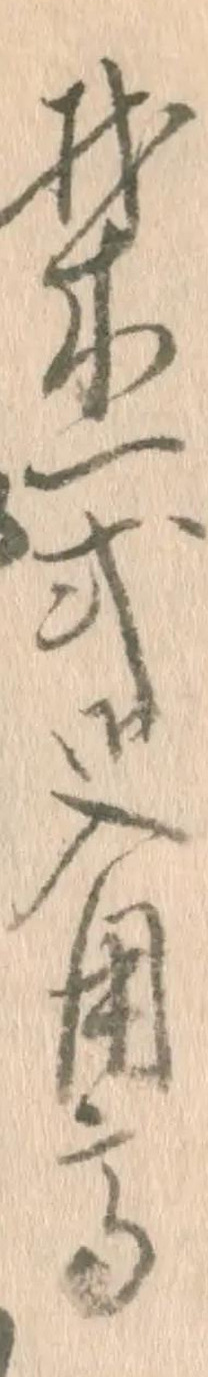材木一式御入用高
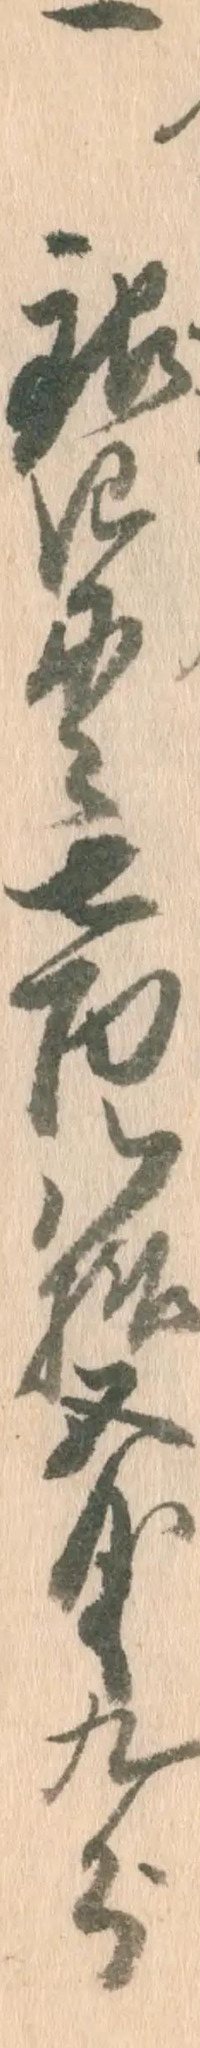一銀四貫七百八拾五匁九分

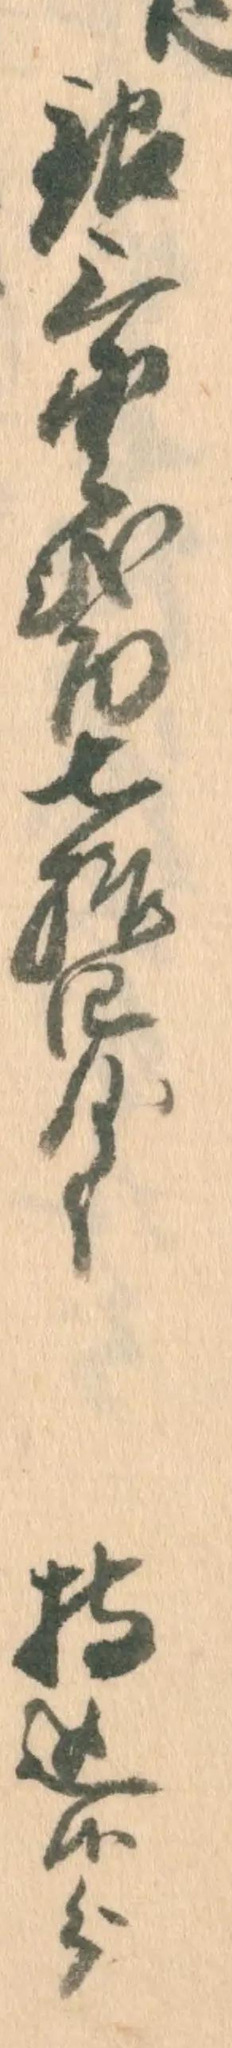銀三貫弐百七拾四匁持込候分
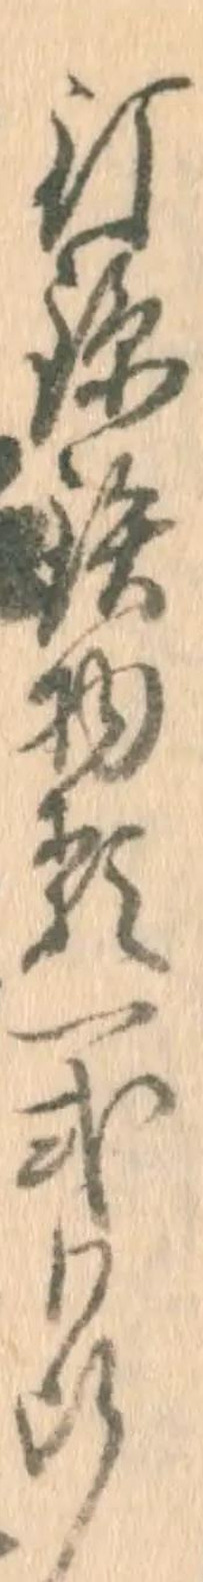釘銯鉄物類一式同断
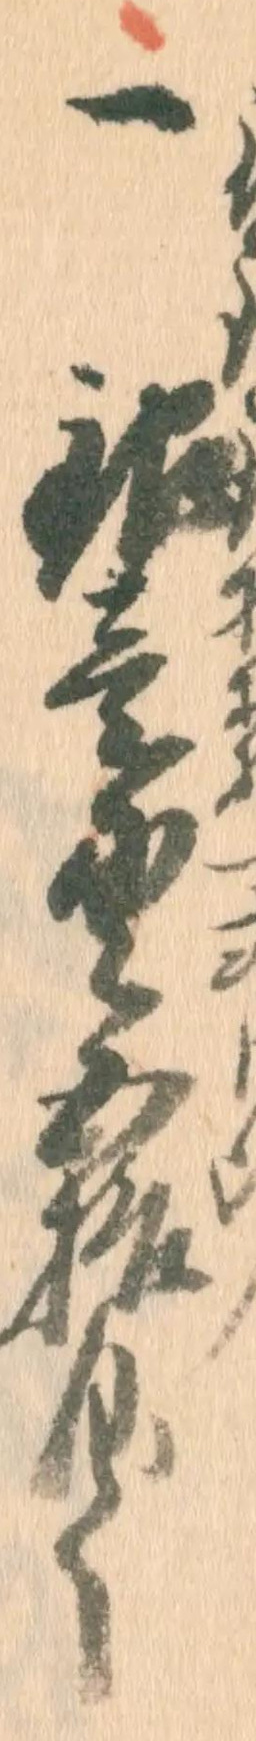一銀壱貫五拾匁
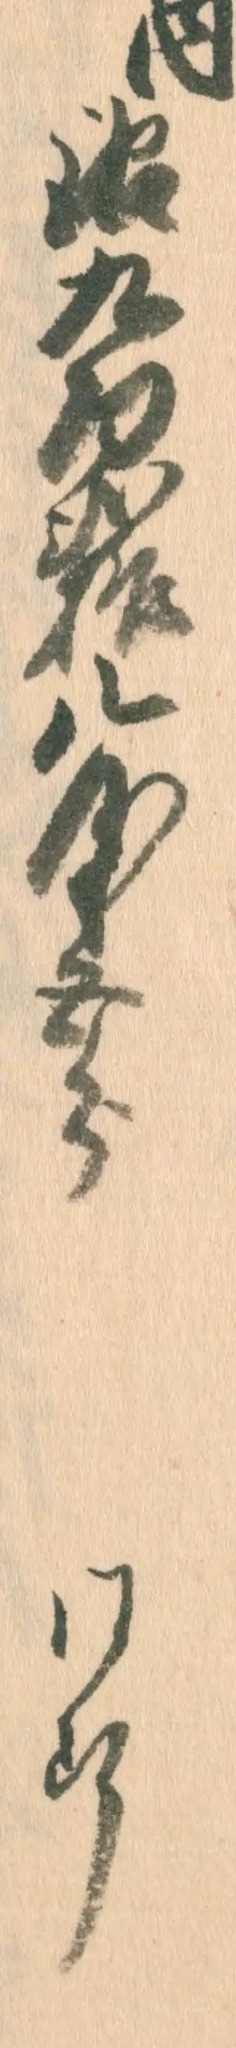銀九百弐拾八匁五分同断
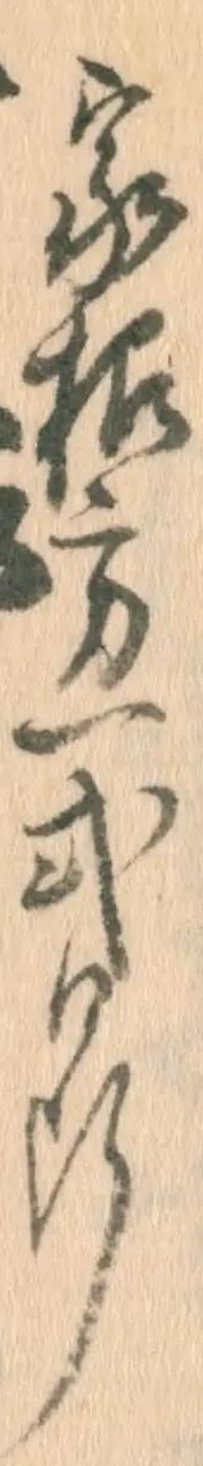家根方一式同断
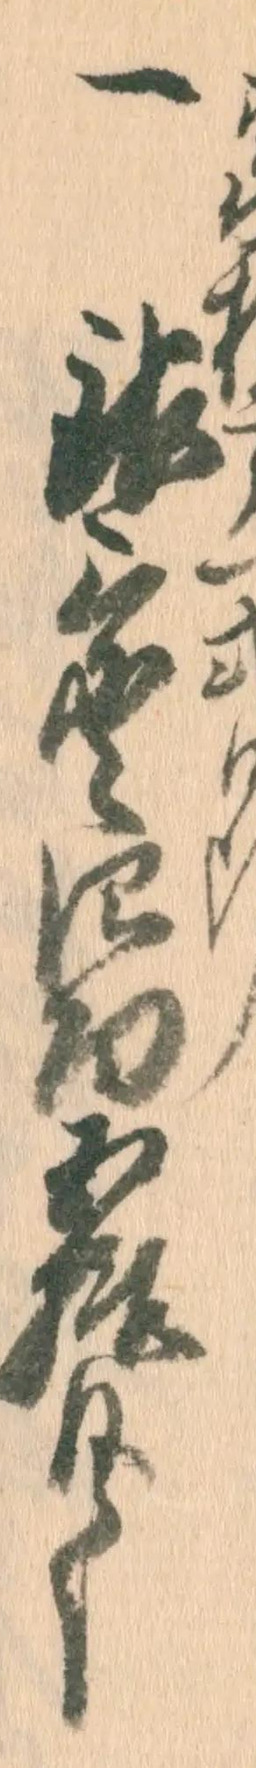一銀三貫四百五拾匁
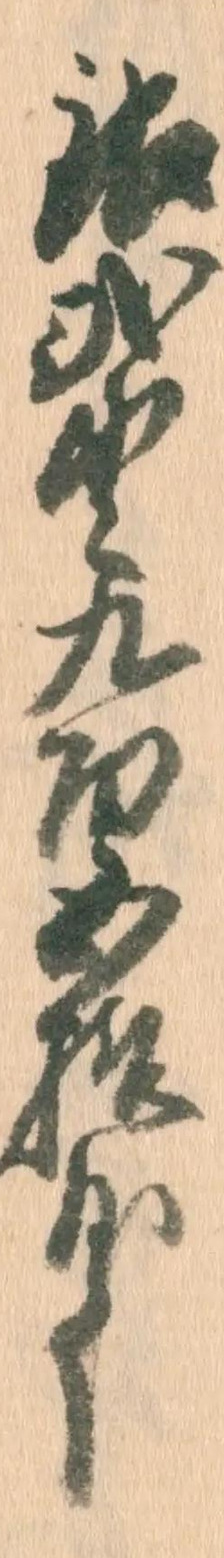銀弐貫九百五拾匁
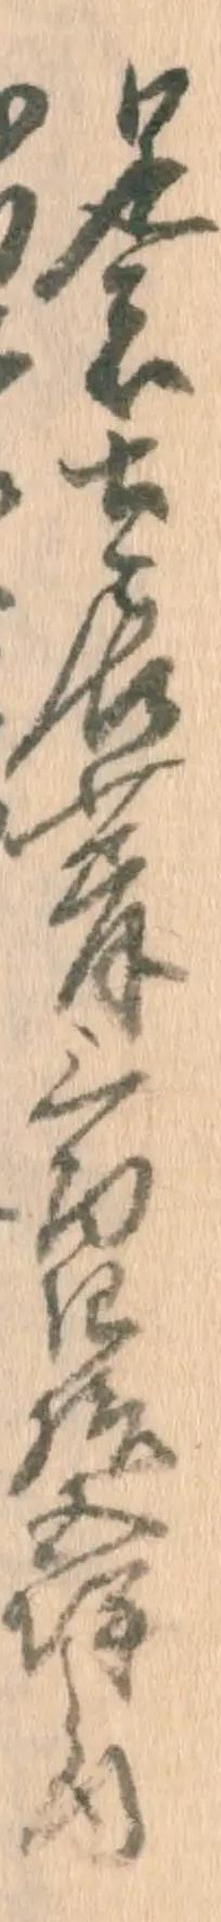是は土居葺三百四拾五坪之内
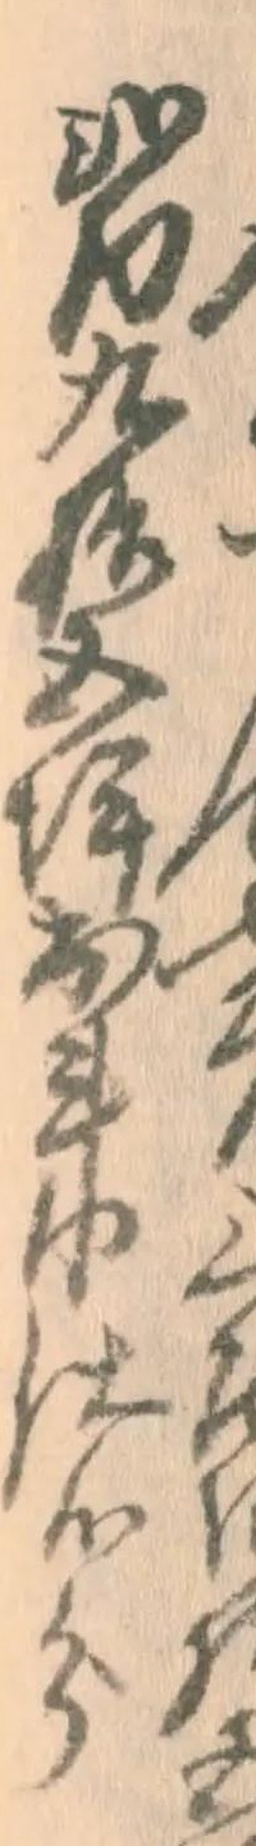弐百九拾五坪出来仕候分
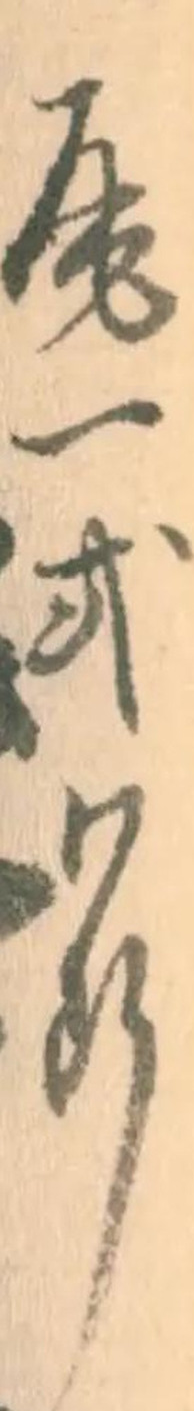瓦一式同断
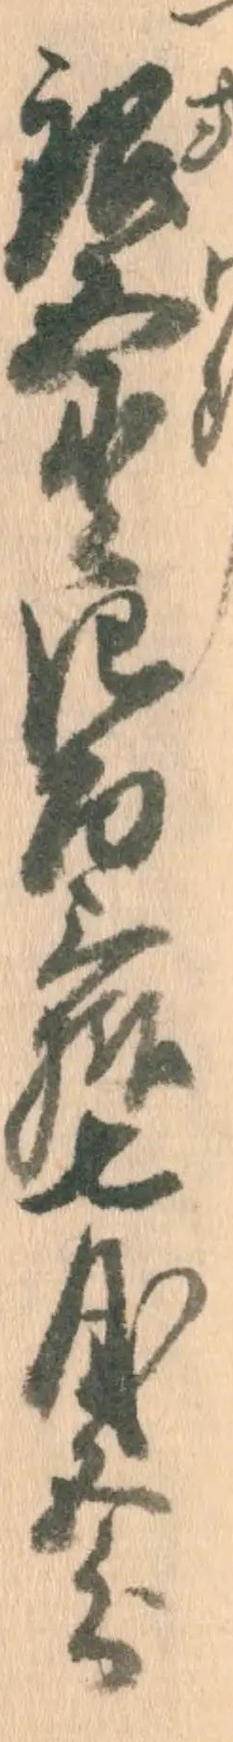一銀五貫四百三拾七匁五分
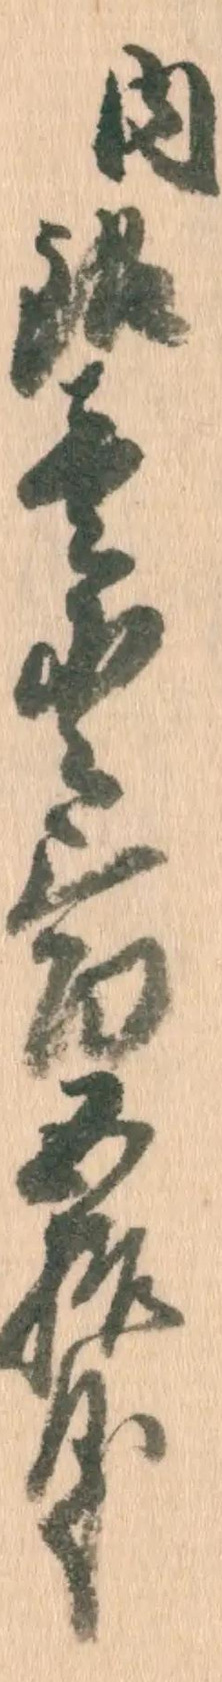銀壱貫三百五拾匁
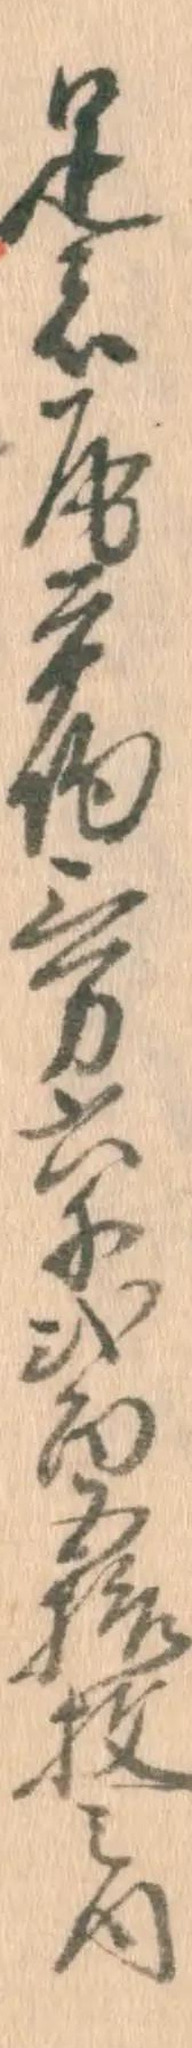是は瓦平物三万六千弐百五拾枚之内
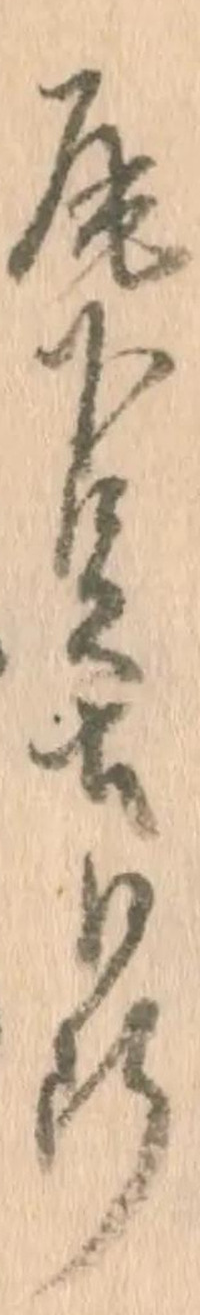瓦下足土同断
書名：三十三間堂. [1]
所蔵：国立国会図書館 National Diet Library, JAPAN
